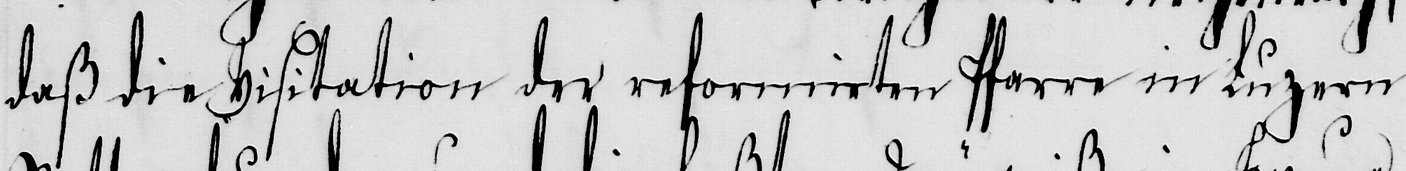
daß die Visitation der reformirten Pfarre in Luzern
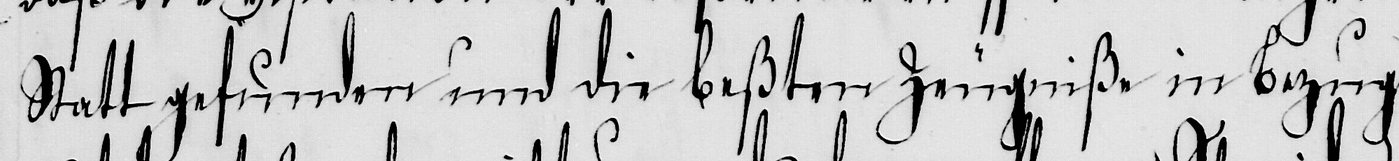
Statt gefunden und die beßten Zeugniße in Bezug
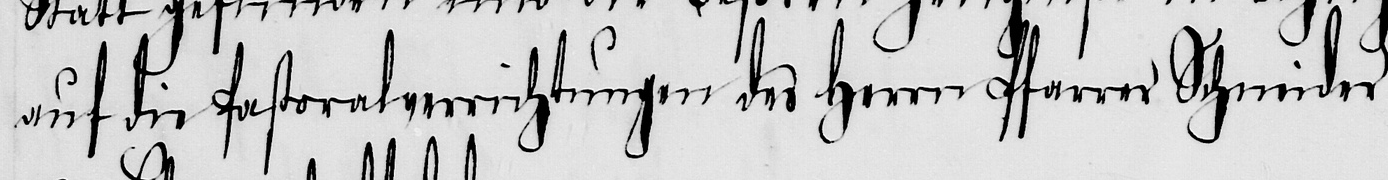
auf die Pastoralverrichtungen des Herrn Pfarrer Schneider
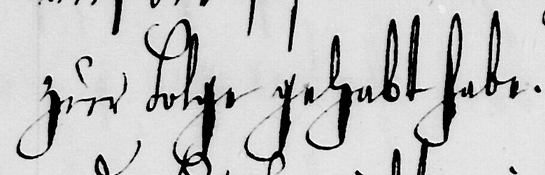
zur Folge gehabt habe.
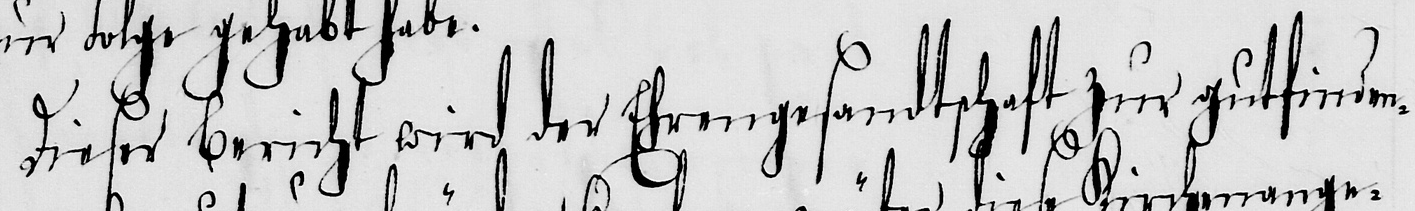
Dieser Bericht wird der Ehrengesandtschaft zur gutfinde¬
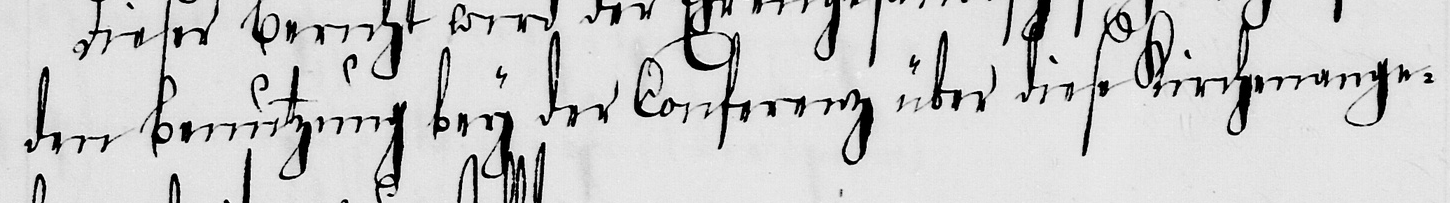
nden Benutzung bey der Conferenz über diese Kirchenange¬
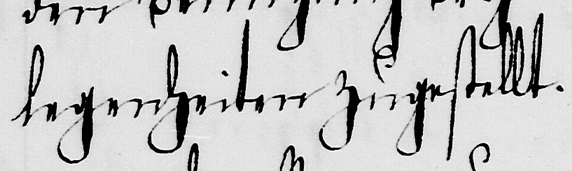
legenheiten zugestell¬
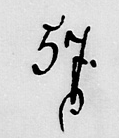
t.
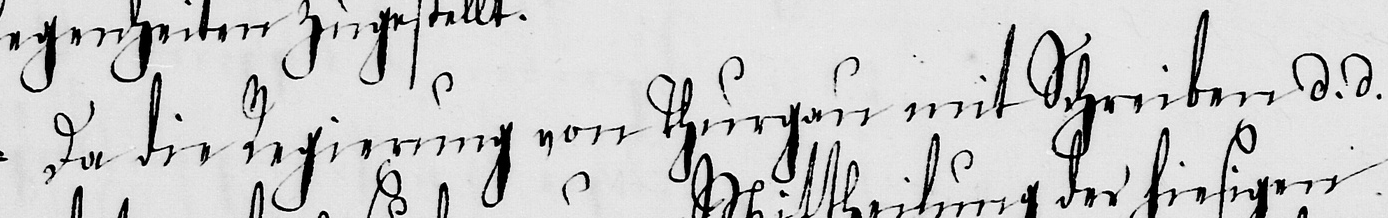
Da die Regierung von Thurgau mit Schreiben d. d.
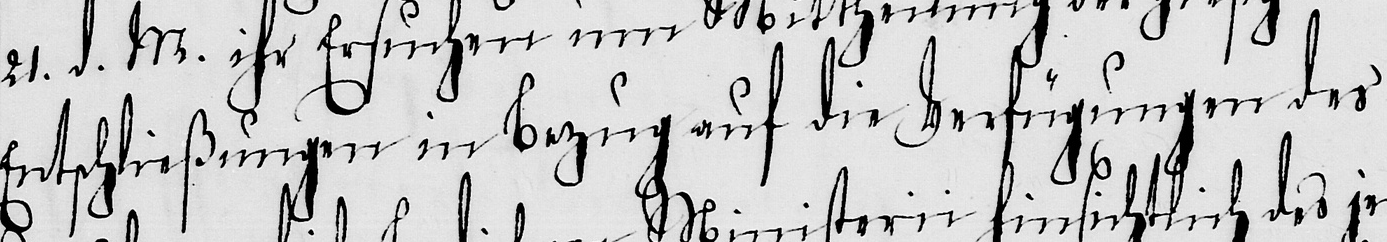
Entschließungen in Bezug auf die Verfügungen des
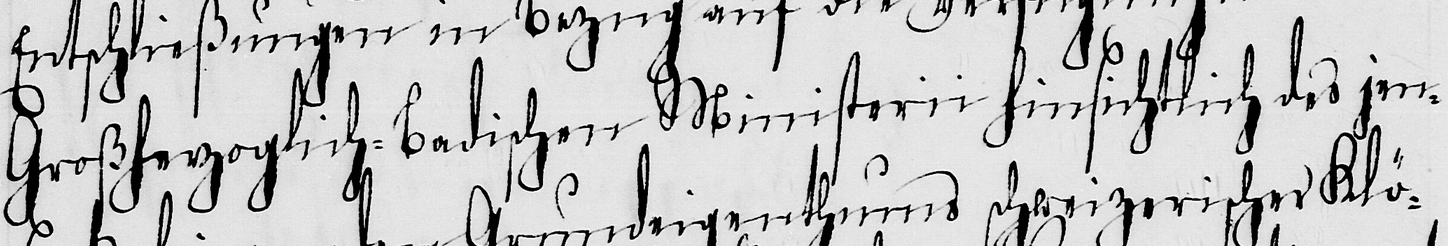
Großherzoglich-Badischen Ministerii hinsichtlich des jen¬
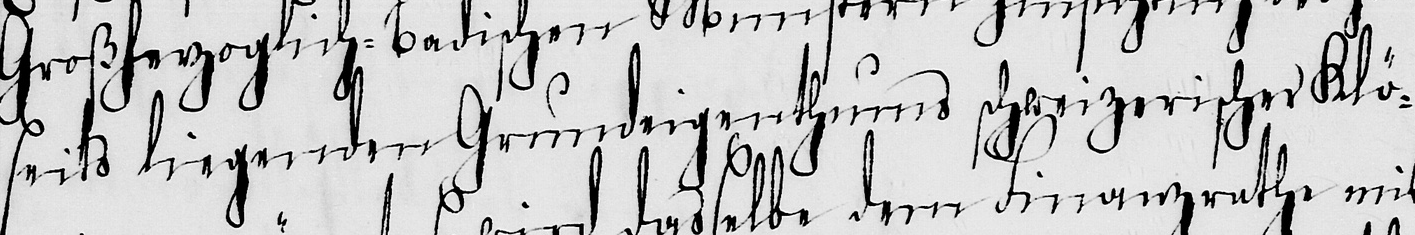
seits liegenden Grundeigenthums schweizerischer Klö¬
